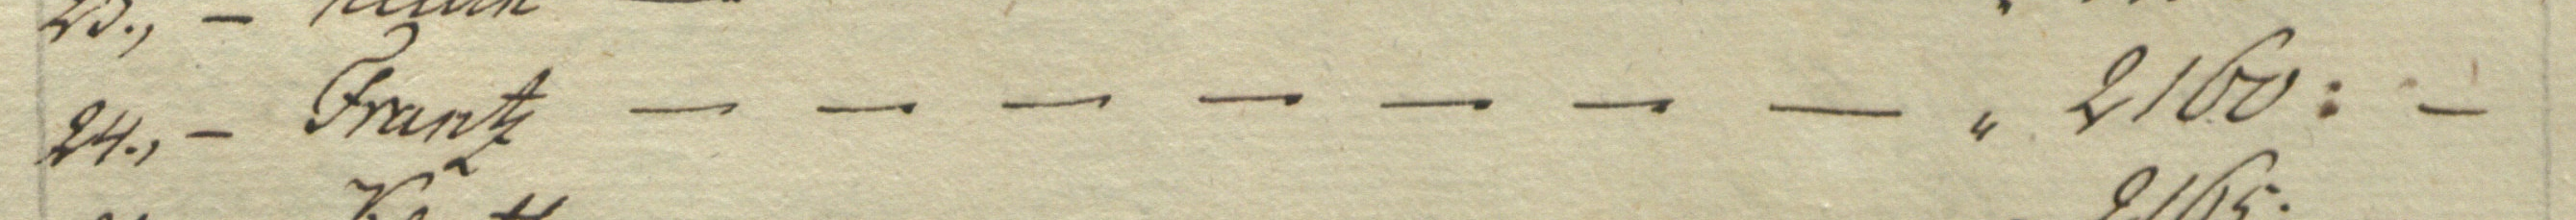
24., Frantz 2160:
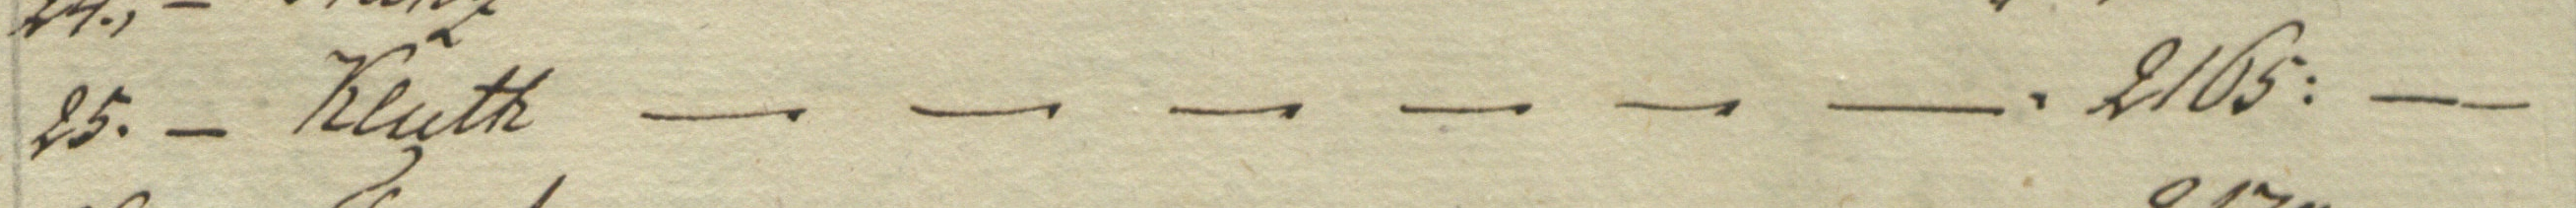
25. Kluth 2165:
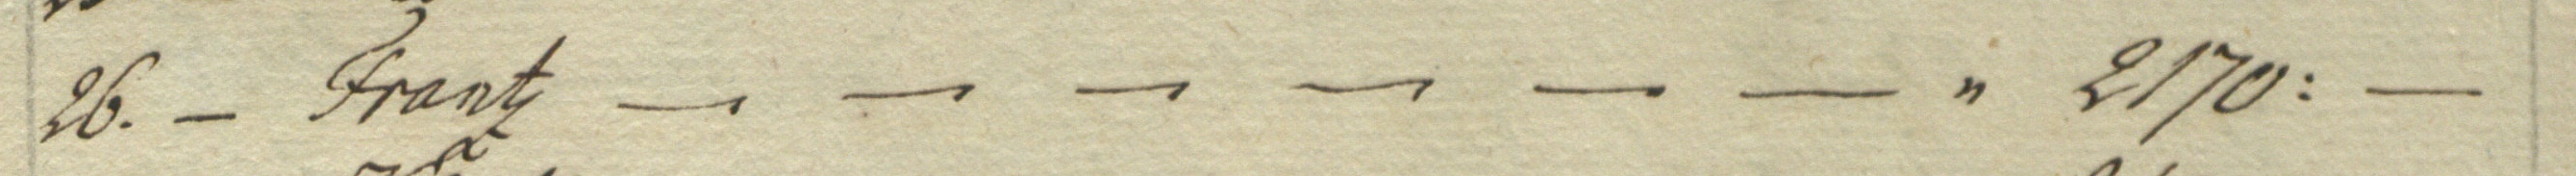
26. Frantz 2170:
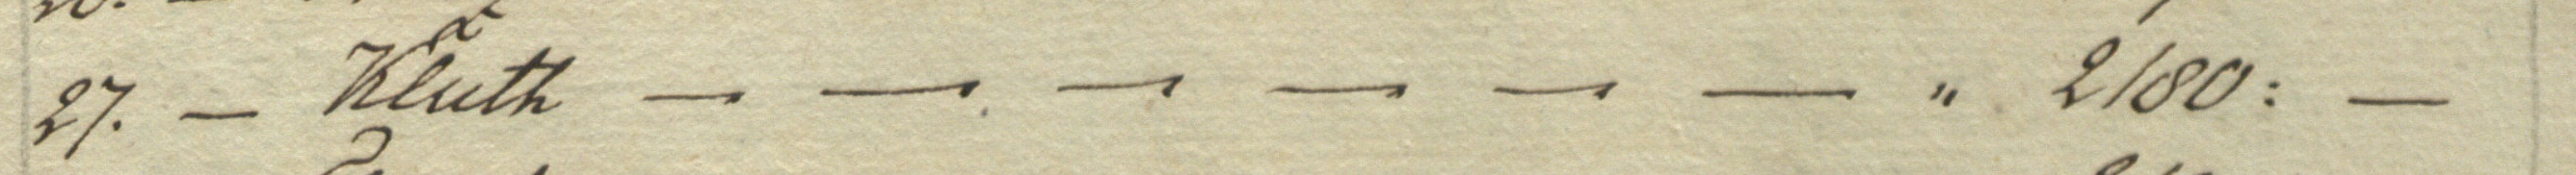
27. Kluth 2180:
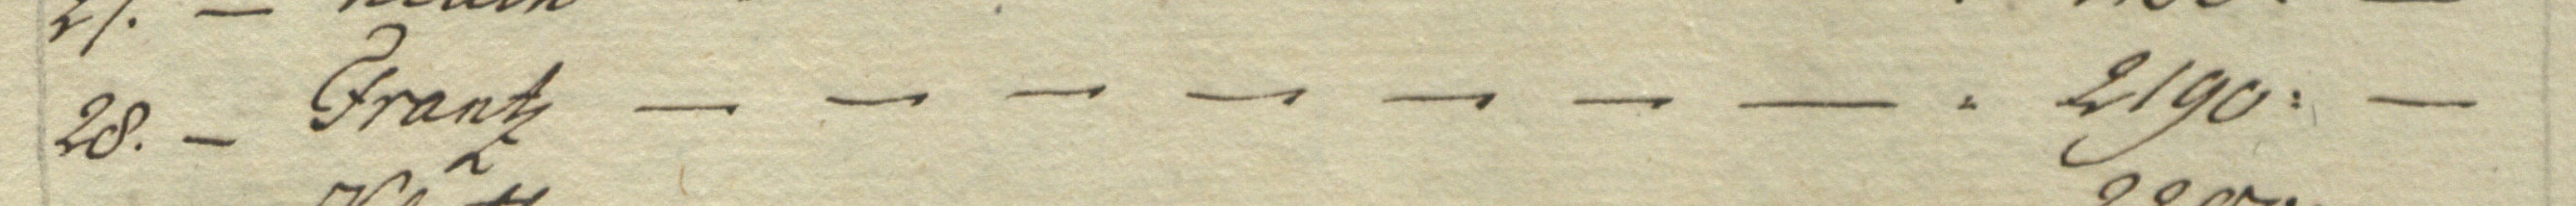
28. Frantz 2190:
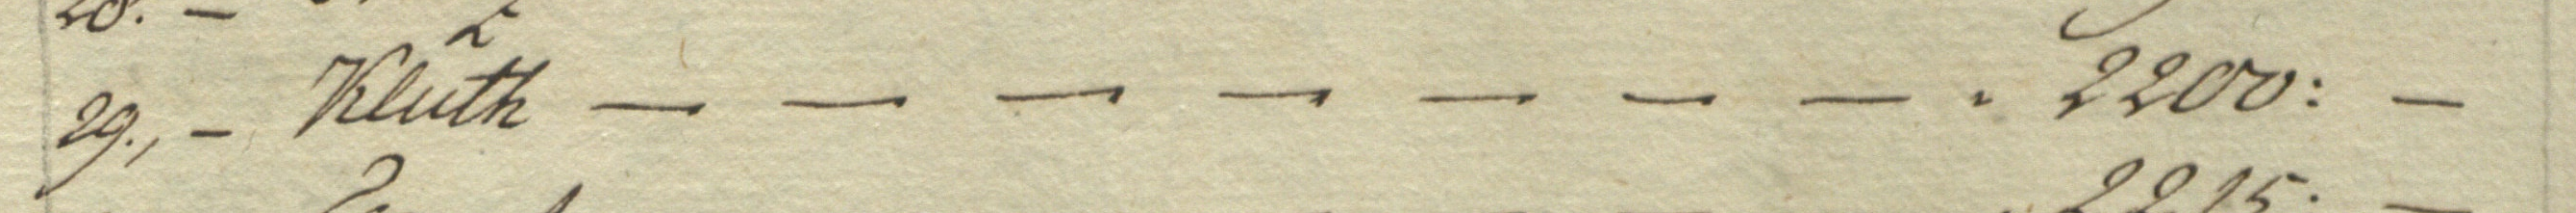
29. Kluth 2200:
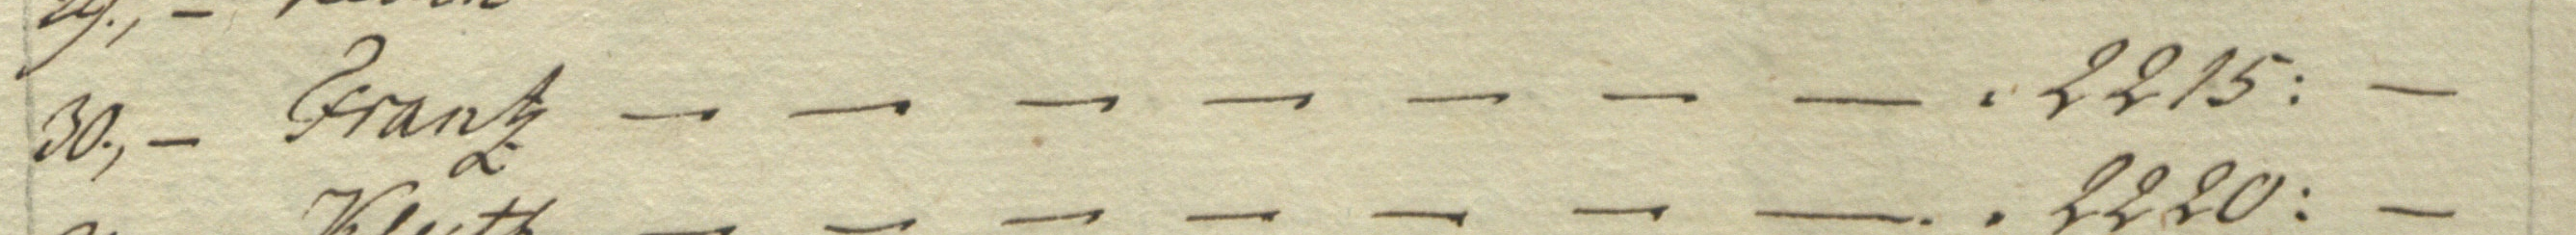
30., Frantz 2215:
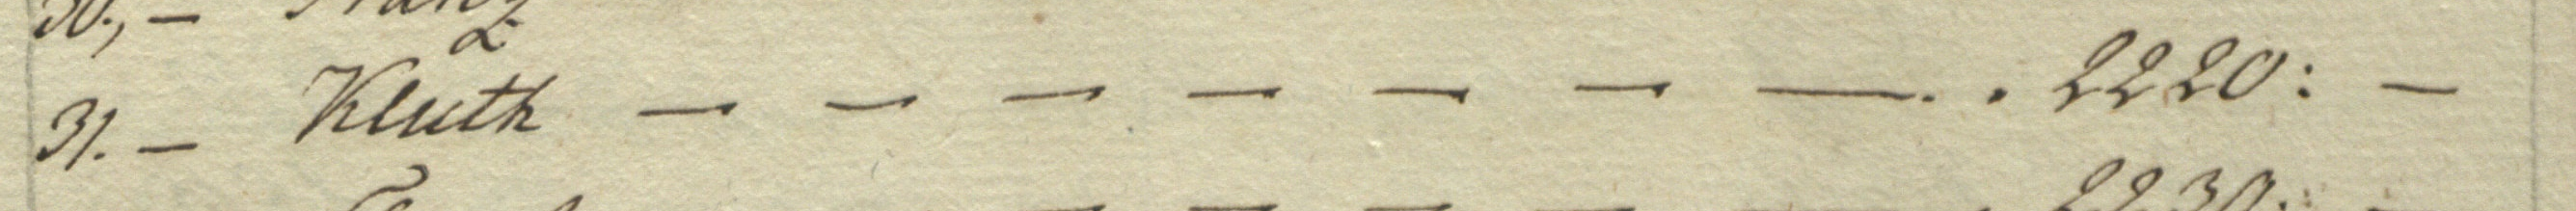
31. Kluth 2220:
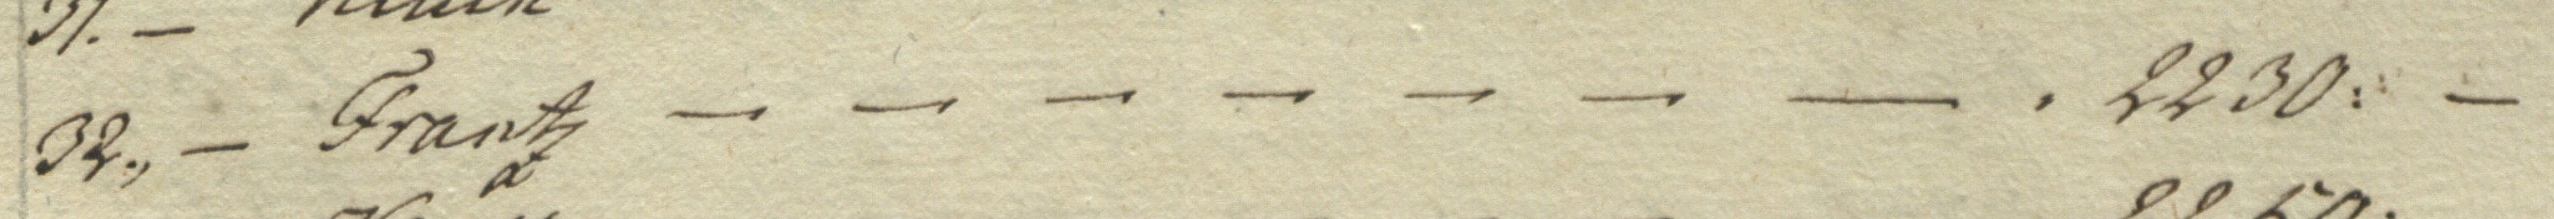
32. Frantz 2230:
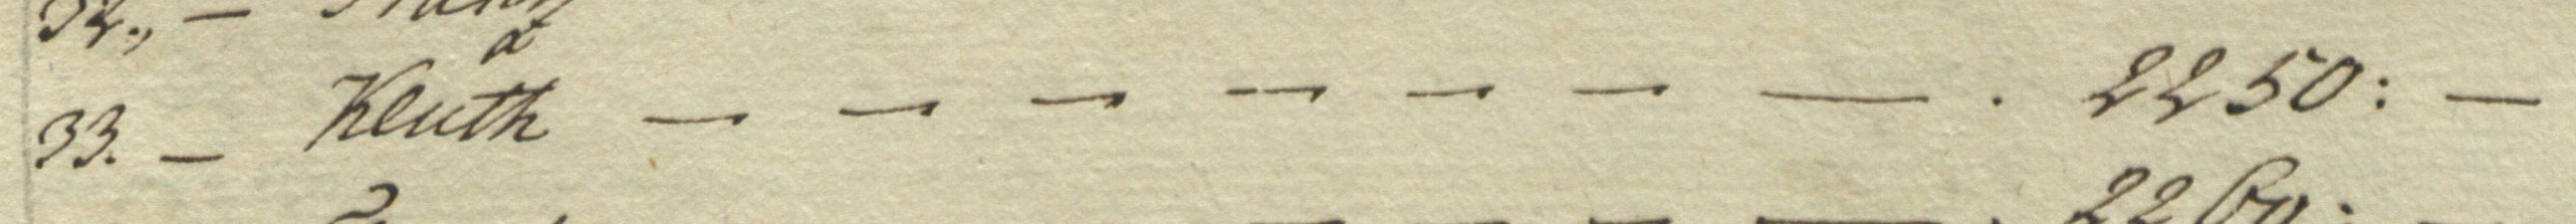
33. Kluth 2250:
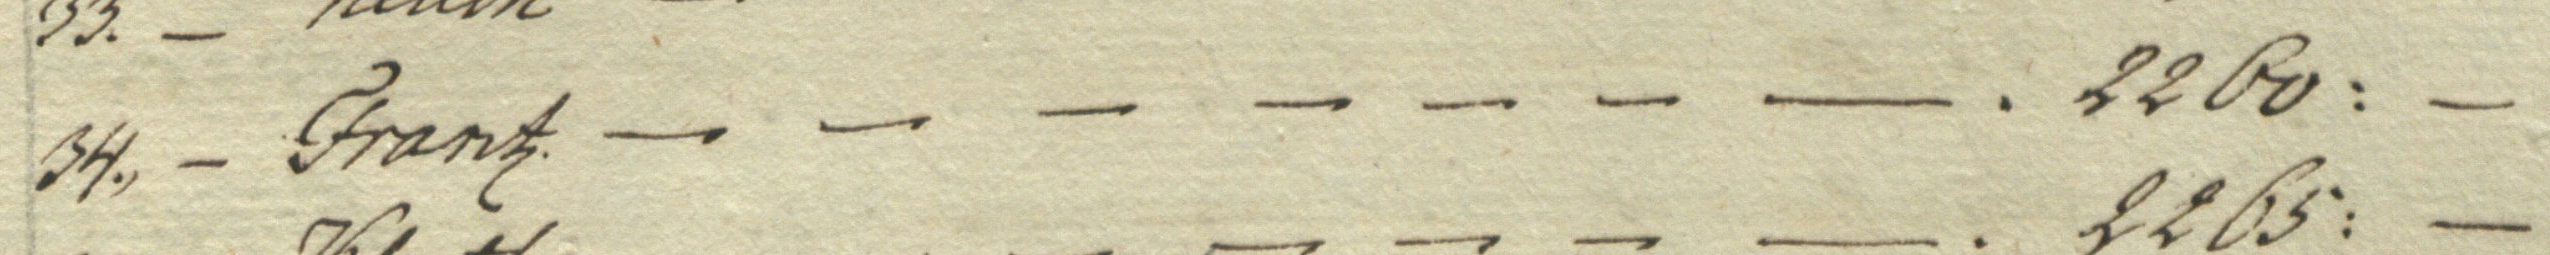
34., Frantz 2260:
